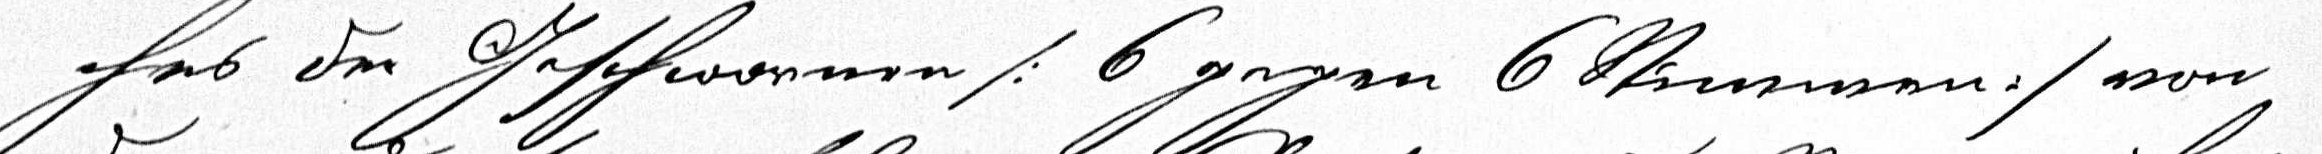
ches der Geschwornen /: 6 gegen 6 Stimmen :/ von
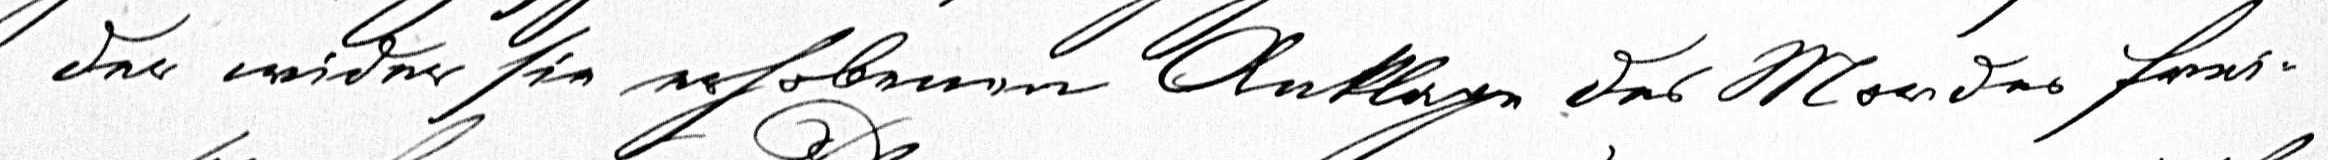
der wider sie erhobenen Anklage des Mordes frei¬
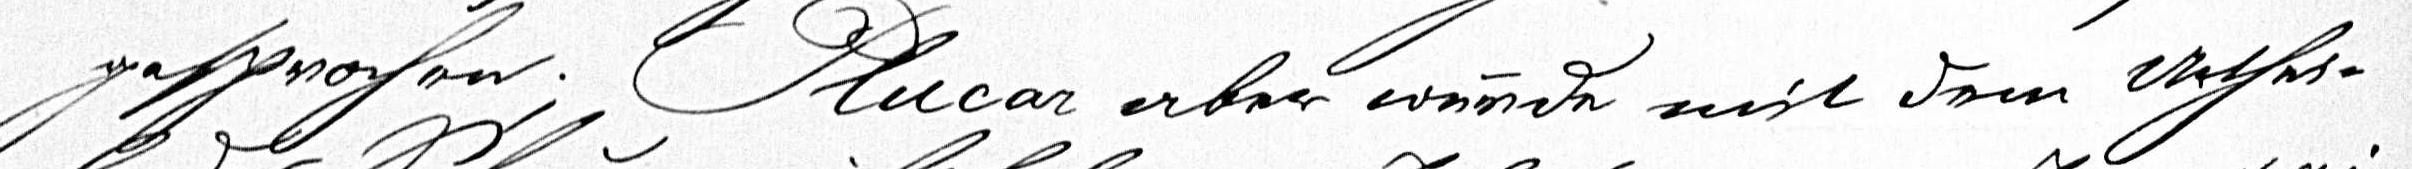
gesprochen. Plucar aber wurde mit dem Urthei¬
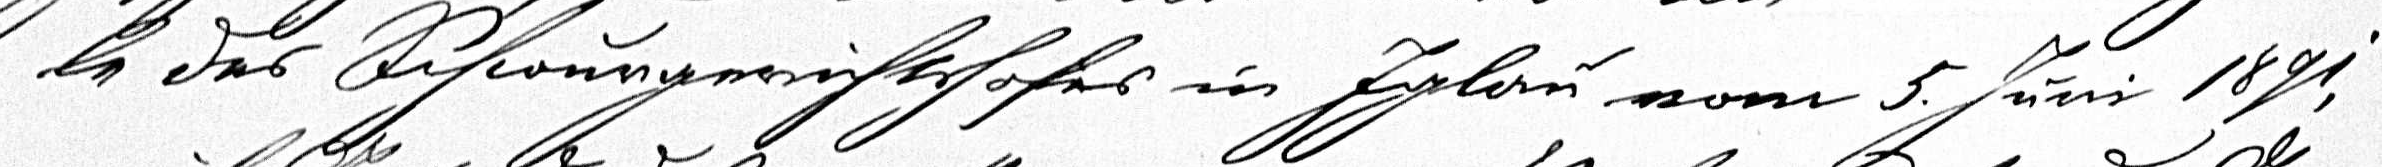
le des Schwurgerichtshofes in Jplau vom 5. Juni 1891,
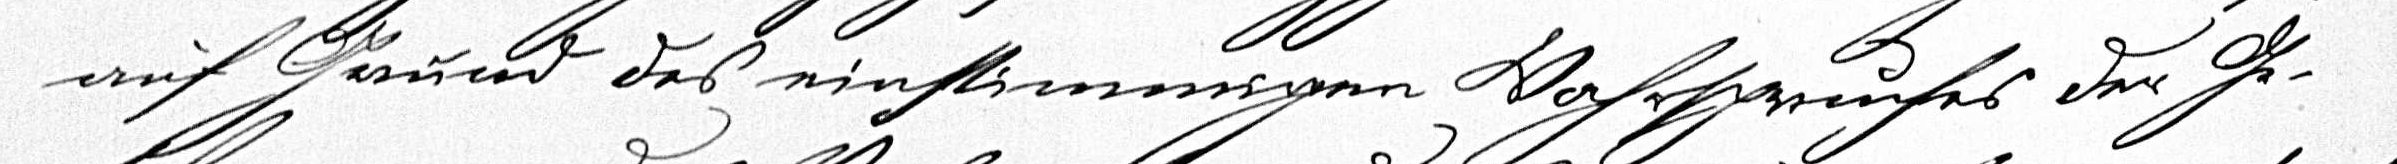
auf Grund des einstimmigen Wahrspruches der Ge¬
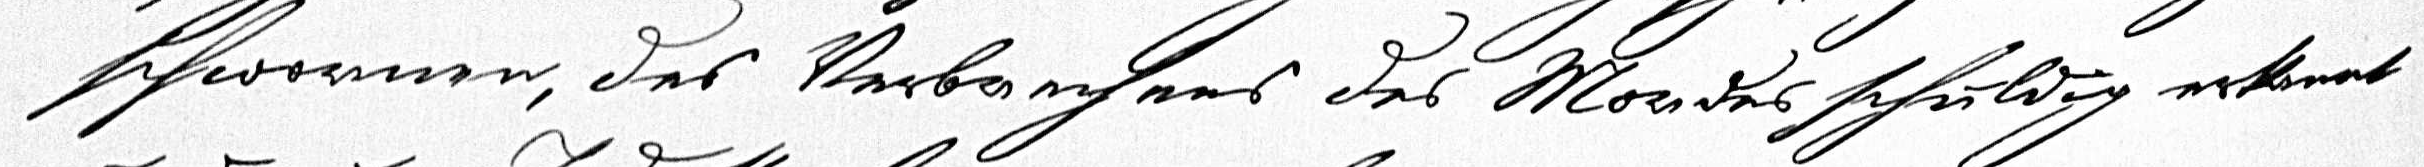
schwornen, des Verbrechens des Mordes schuldig erkannt
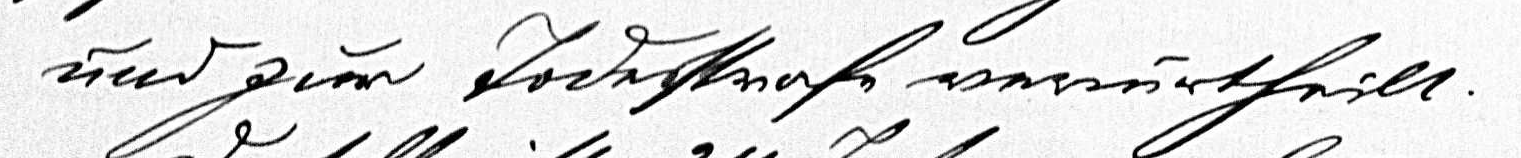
und zur Todesstrafe verurtheilt.
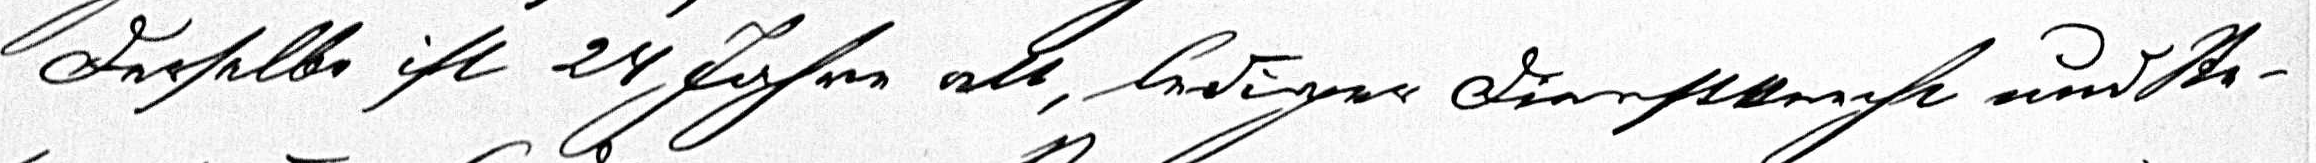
Derselbe ist 24 Jahre alt, lediger Dienstknecht und Re¬
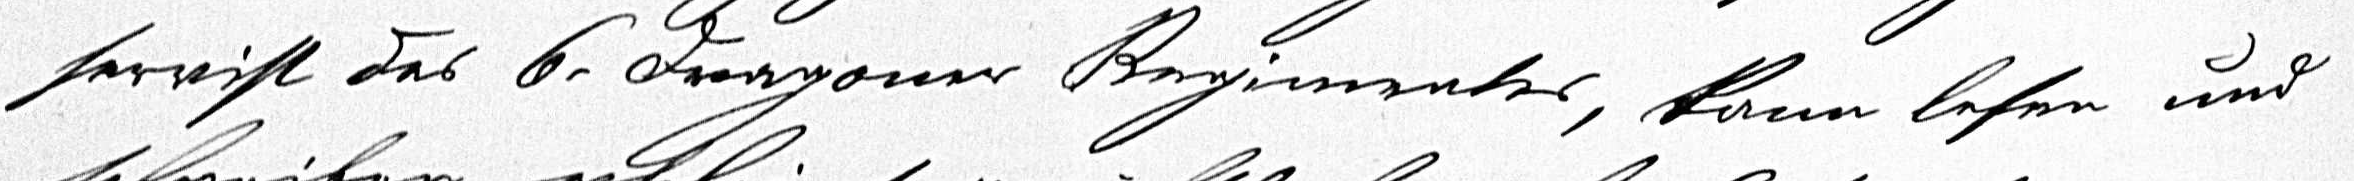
servist des 6. Dragoner Regimentes, kann lesen und
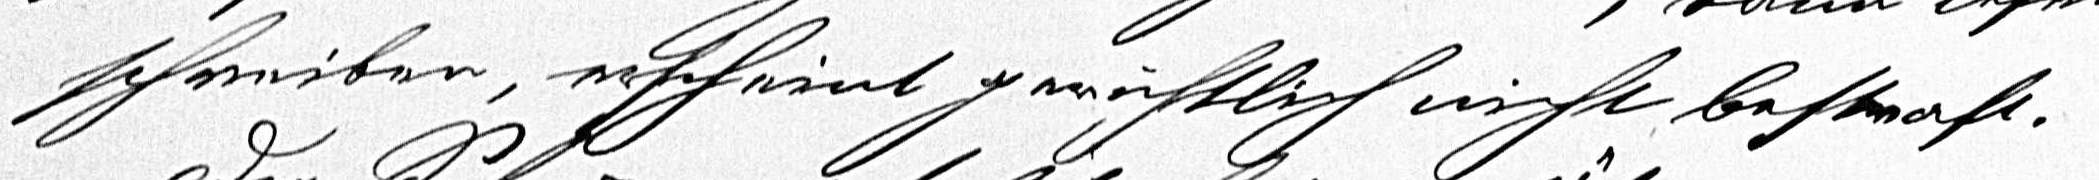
schreiben, erscheint gerichtlich nicht bestraft.
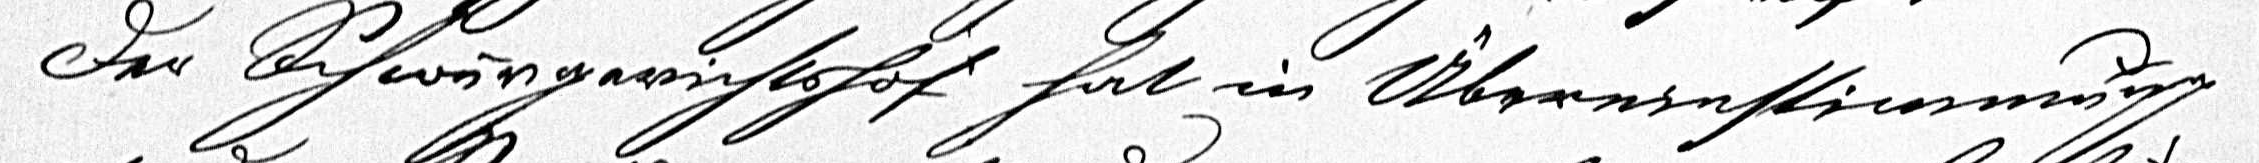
Der Schwurgerichtshof hat in Übereinstimmung
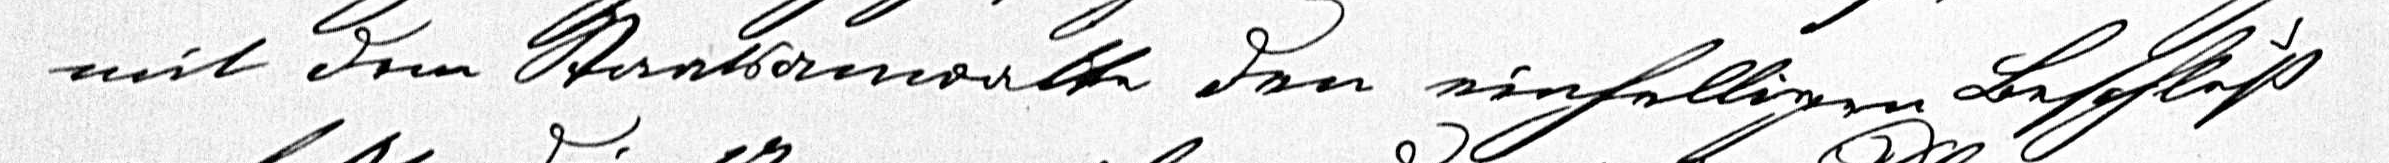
mit dem Staatsanwalte den einhelligen Beschluß
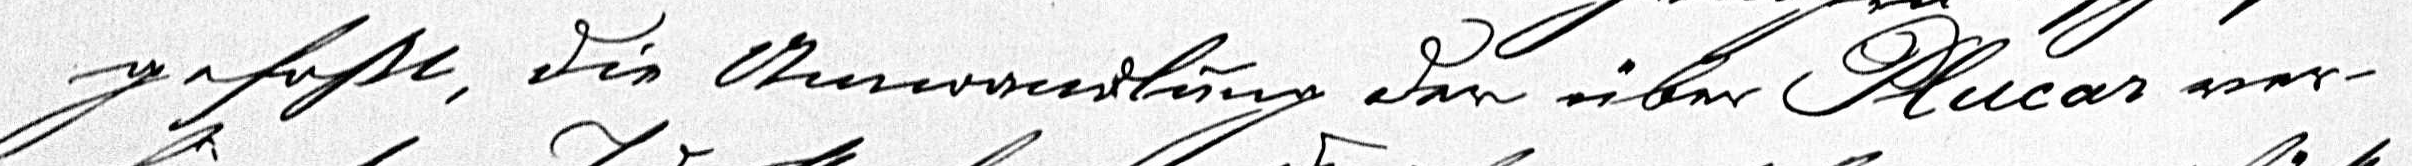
gefaßt, die Umwandlung der über Plucar ver¬
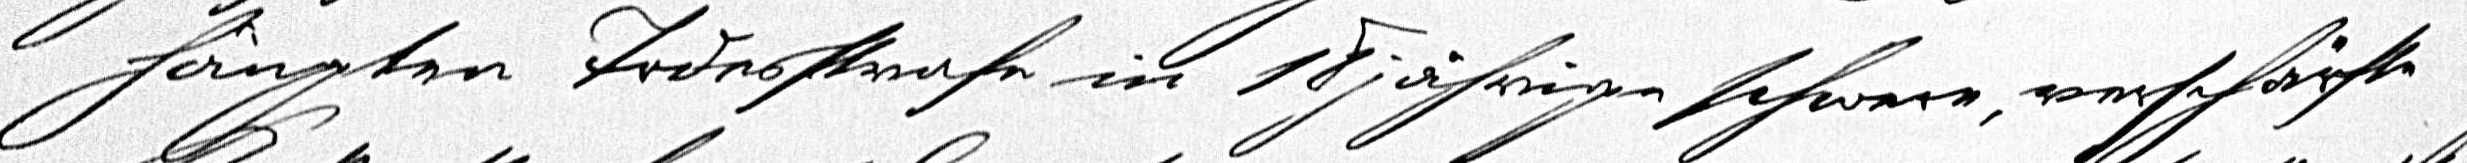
hängten Todesstrafe in 18jährige schwere, verschärfte
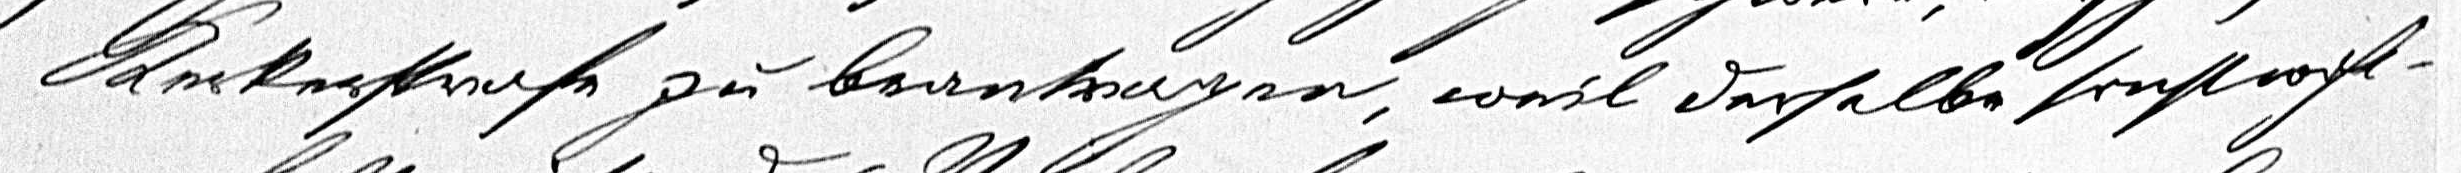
Kerkerstrafe zu beantragen, weil derselbe sonst wohl¬
